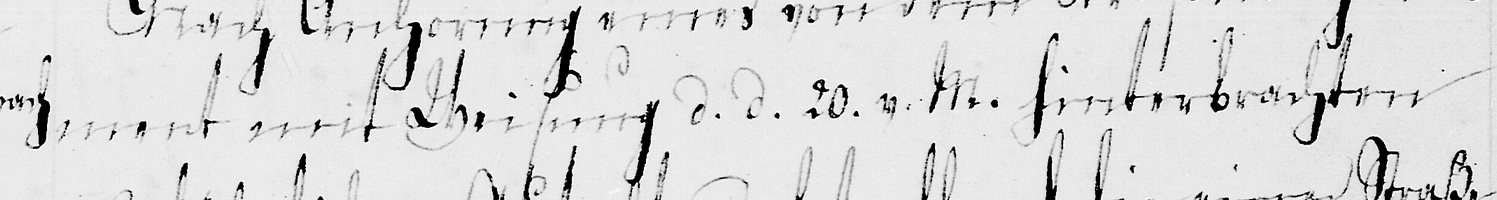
ment mit Weisung d. d. 20. v. M. hinterbrachten
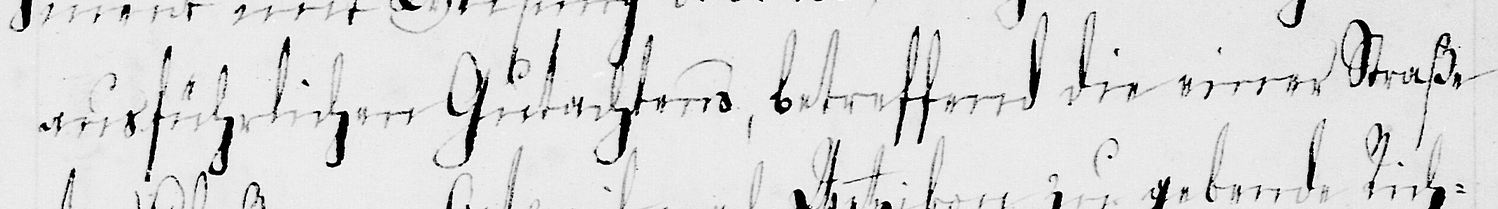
ausführlichen Gutachtens, betreffend die einer Straße
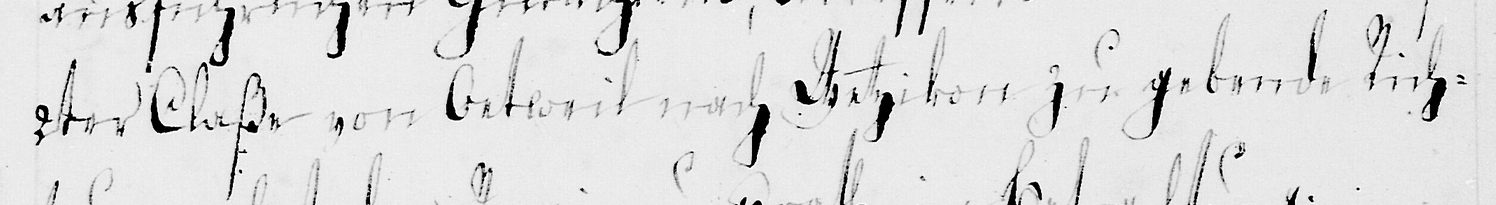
2ter Claße von Oetweil nach Wetzikon zu gebende Rich¬
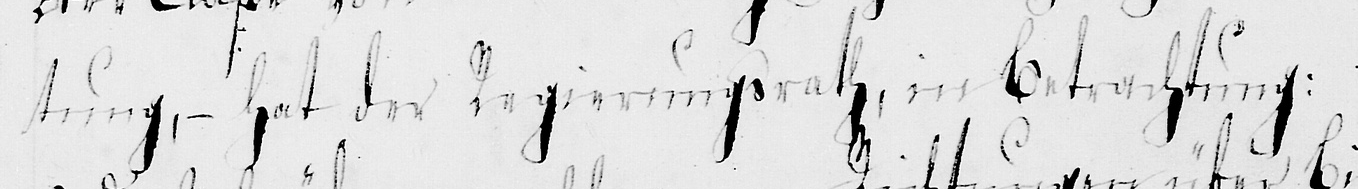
tung, – hat der Regierungsrath, in Betrachtung:
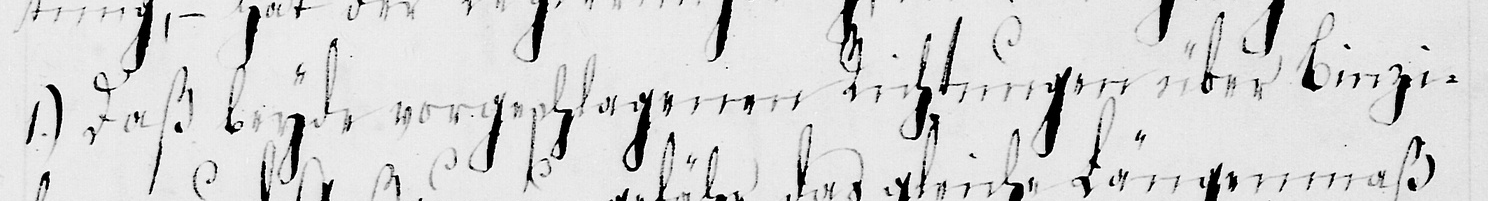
1.) Daß beyde vorgeschlagenen Richtungen über Binzi¬
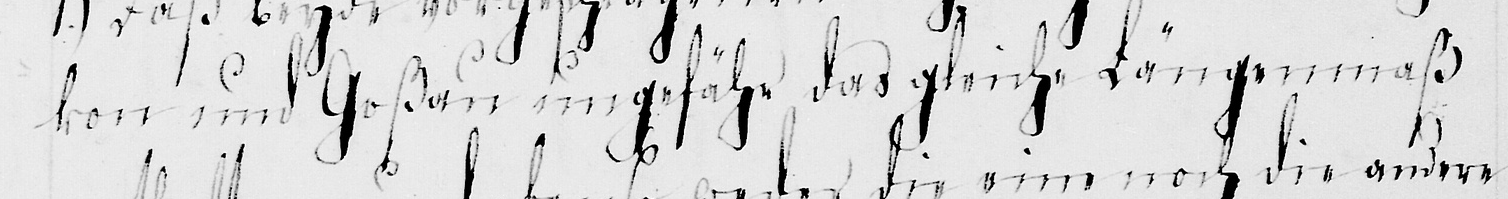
kon und Goßau ungefähr das gleiche Längenmaß
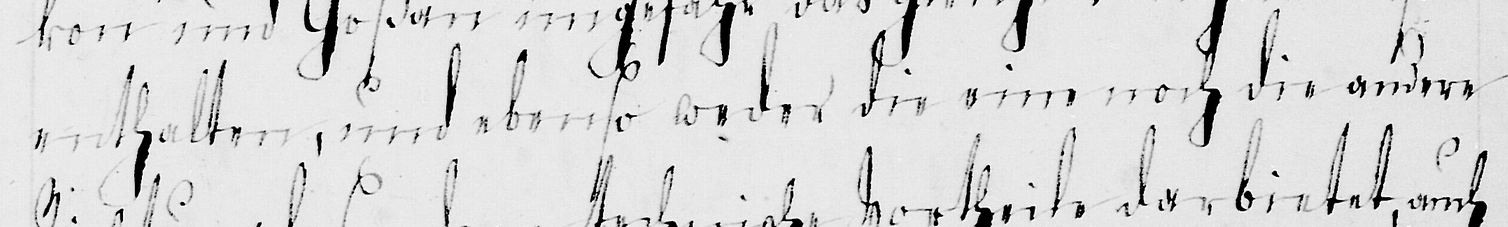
enthalten, und ebenso weder die eine noch die andere
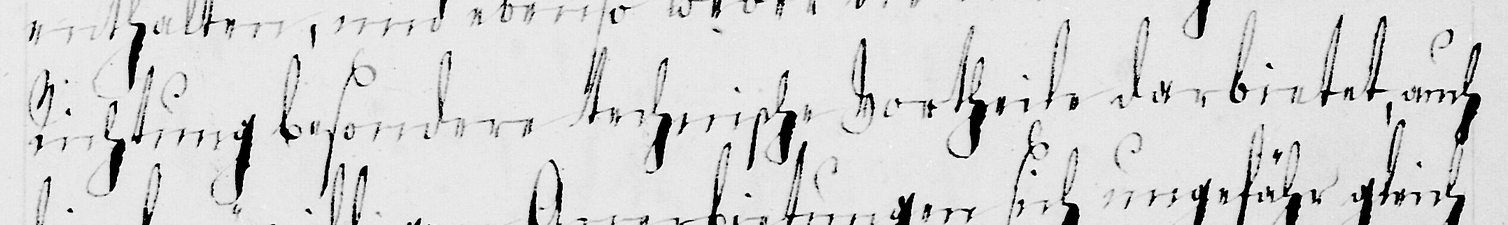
Richtung besondere technische Vortheile darbietet, auch
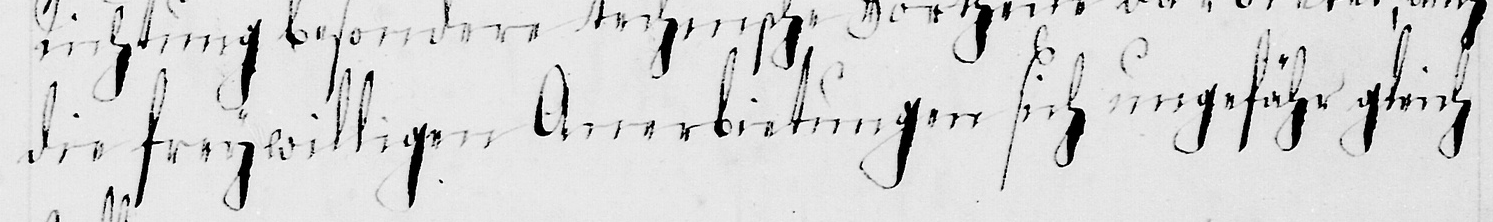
die freywilligen Anerbietungen sich ungefähr gleich
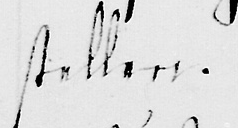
stellen.
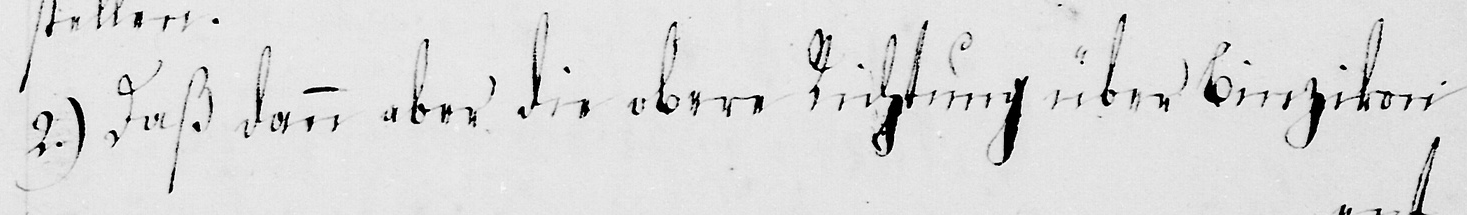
2.) Daß dann aber die obere Richtung über Binzikon
